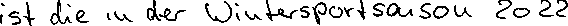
ist die in der Wintersportsaison 2022
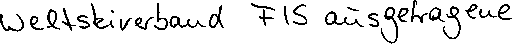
Weltskiverband FIS ausgetragene
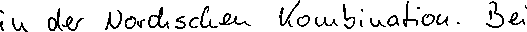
in der Nordischen Kombination. Bei
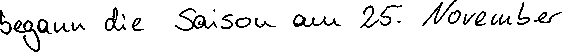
begann die Saison am 25. November
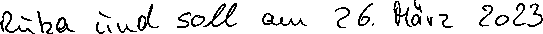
Ruka und soll am 26. März 2023
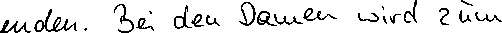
enden. Bei den Damen wird zum
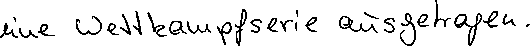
eine Wettkampfserie ausgetragen.
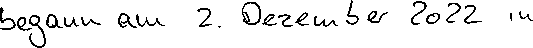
begann am 2. Dezember 2022 in
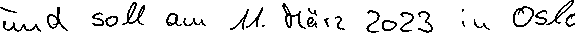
und soll am 11. März 2023 in Oslo
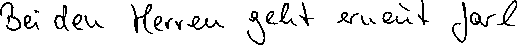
Bei den Herren geht erneut Jarl
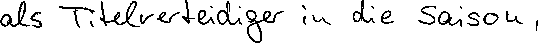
als Titelverteidiger in die Saison,
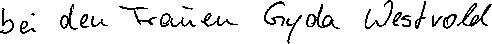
bei den Frauen Gyda Westvold
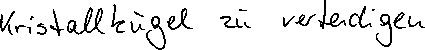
Kristallkugel zu verteidigen
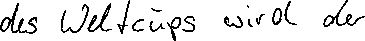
des Weltcups wird der
